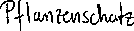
Pflanzenschutz
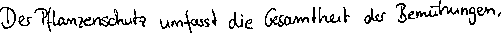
Der Pflanzenschutz umfasst die Gesamtheit der Bemühungen,
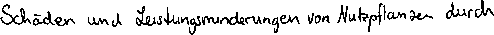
Schäden und Leistungsminderungen von Nutzpflanzen durch
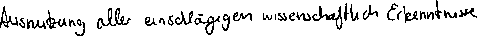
Ausnutzung aller einschlägigen wissenschaftlich Erkenntnisse
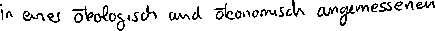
in einer ökologisch und ökonomisch angemessenen
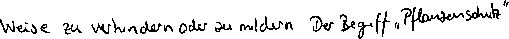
Weise zu verhindern oder zu mildern.Der Begriff "Pflanzenschutz"
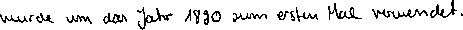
wurde um das Jahr 1890 zum ersten Mal verwendet.
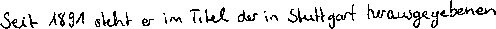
Seit 1891 steht er im Titel der in Stuttgart herausgegebenen
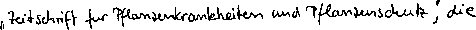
"Zeitschrift für Pflanzenkrankheiten und Pflanzenschutz", die
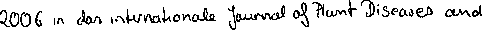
2006 in das internationale Journal of Plant Diseases and
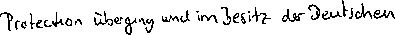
Protection überging und im Besitz der Deutschen
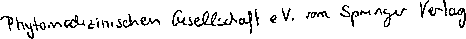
Phytomedizinischen Gesellschaft e.V. vom Springer Verlag
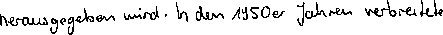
herausgegeben wird. In den 1950er Jahren verbreitete
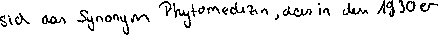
sich das Synonym Phytomedizin, das in den 1930er
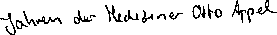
Jahren der Mediziner Otto Appel
